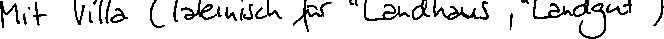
Mit Villa (lateinisch für "Landhaus", "Landgut")
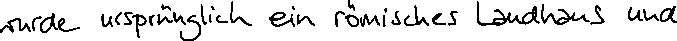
wurde ursprünglich ein römisches Landhaus und
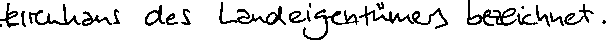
Herrenhaus des Landeigentümers bezeichnet.
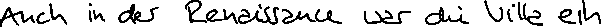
Auch in der Renaissance war die Villa ein
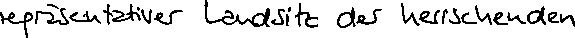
repräsentativer Landsitz der herrschenden
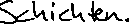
Schichten.
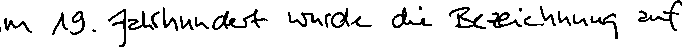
Im 19. Jahrhundert wurde die Bezeichnung auf
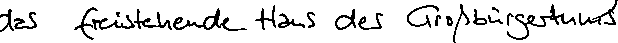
das freistehende Haus des Großbürgertums
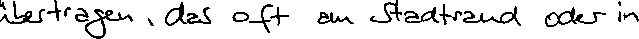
übertragen, das oft am Stadtrand oder in
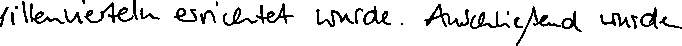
Villenvierteln errichtet wurde. Anschließend wurde
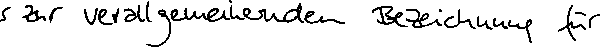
r zur verallgemeinernden Bezeichnung für
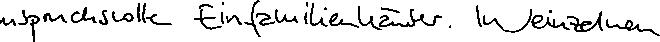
nspruchsvolle Einfamilienhäuser.In einzelnen
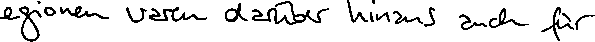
egionen waren darüber hinaus auch für
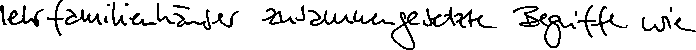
ehrfamilienhäuser zusammengesetzte Begriffe wie
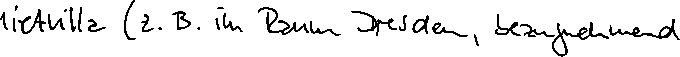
ietvilla (z. B. im Raum Dresden, bezugnehmend
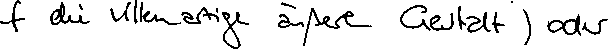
f die villenartige äußere Gestalt) oder
